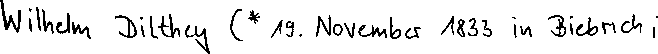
Wilhelm Dilthey (* 19. November 1833 in Biebrich;
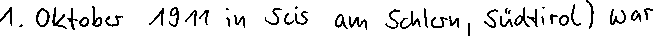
1. Oktober 1911 in Seis am Schlern, Südtirol) war
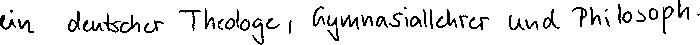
ein deutscher Theologe, Gymnasiallehrer und Philosoph.
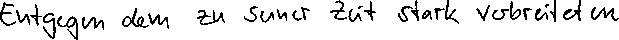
Entgegen dem zu seiner Zeit stark verbreiteten
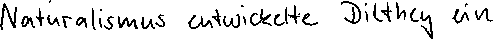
Naturalismus entwickelte Dilthey ein
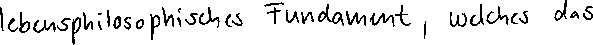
lebensphilosophisches Fundament, welches das
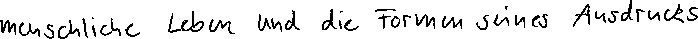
menschliche Leben und die Formen seines Ausdrucks
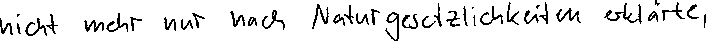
nicht mehr nur nach Naturgesetzlichkeiten erklärte,
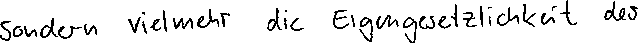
sondern vielmehr die Eigengesetzlichkeit des
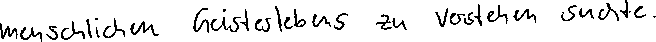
menschlichen Geisteslebens zu verstehen suchte.
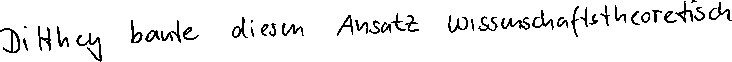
Dilthey baute diesen Ansatz wissenschaftstheoretisch
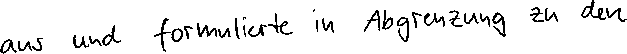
aus und formulierte in Abgrenzung zu den
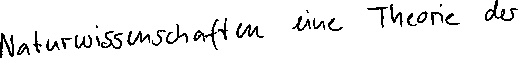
Naturwissenschaften eine Theorie der
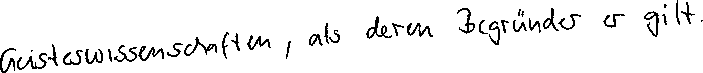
Geisteswissenschaften, als deren Begründer er gilt.
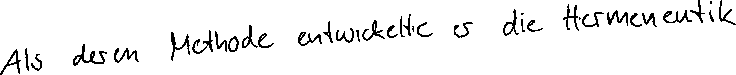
Als deren Methode entwickelte er die Hermeneutik
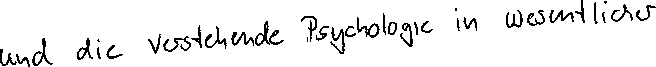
und die verstehende Psychologie in wesentlicher
